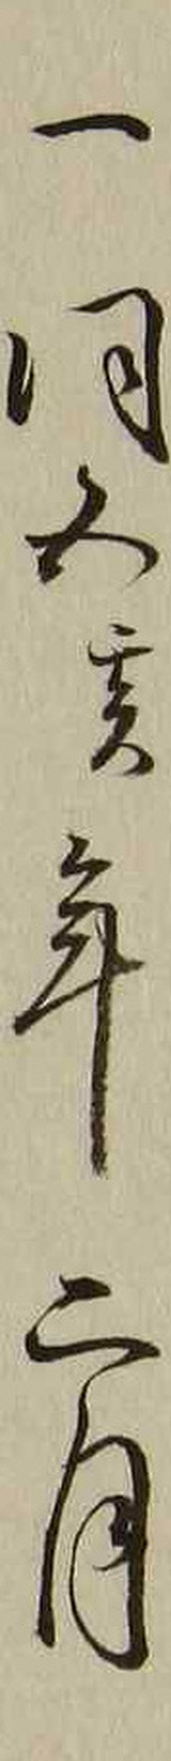一同五亥年二月
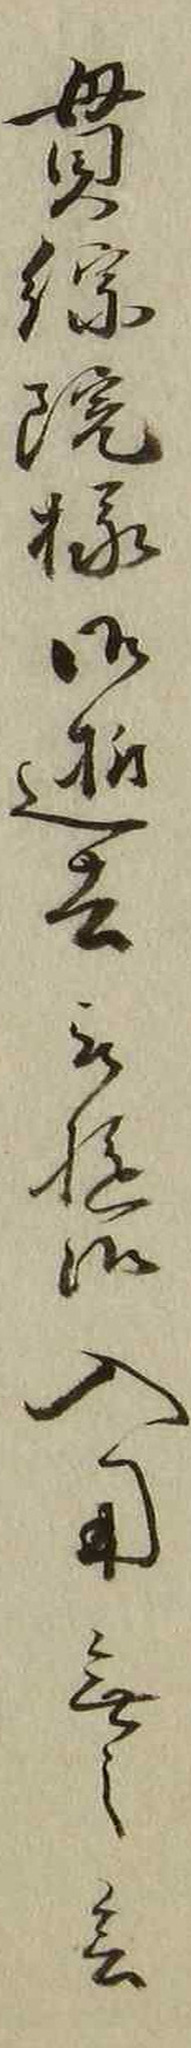貫綜院様御逝去被遊御入用無之会
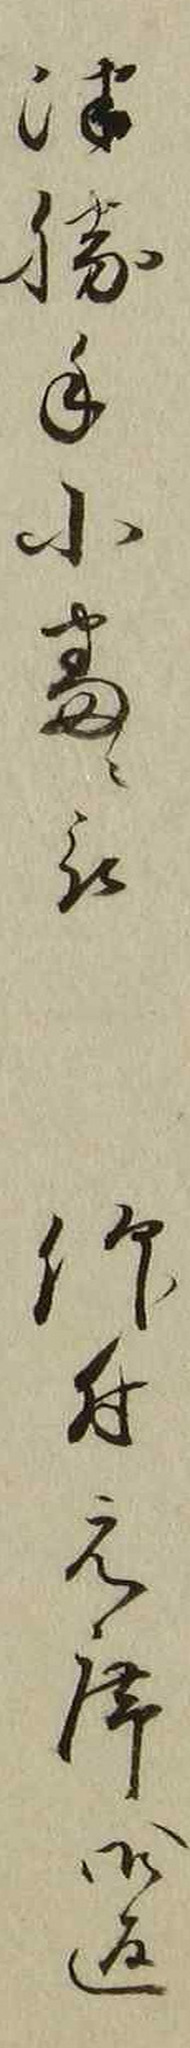津勝手小番ニ被仰付元席へ御返
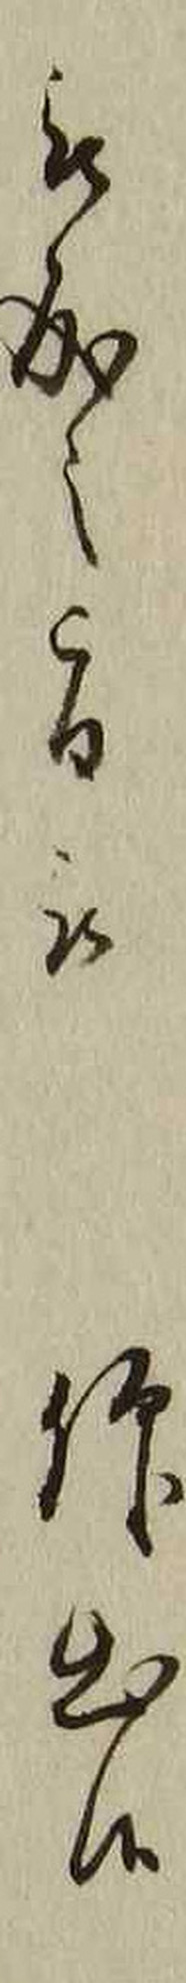被成之旨被仰出候
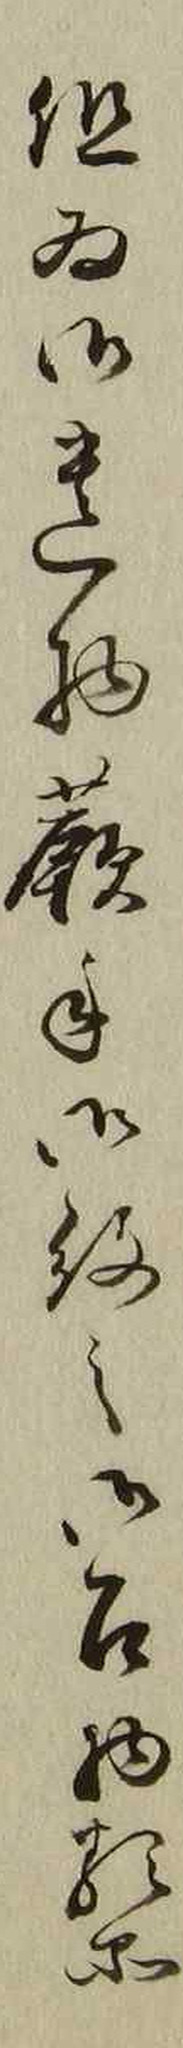但為御遺物蕨手御紋之御召物類品
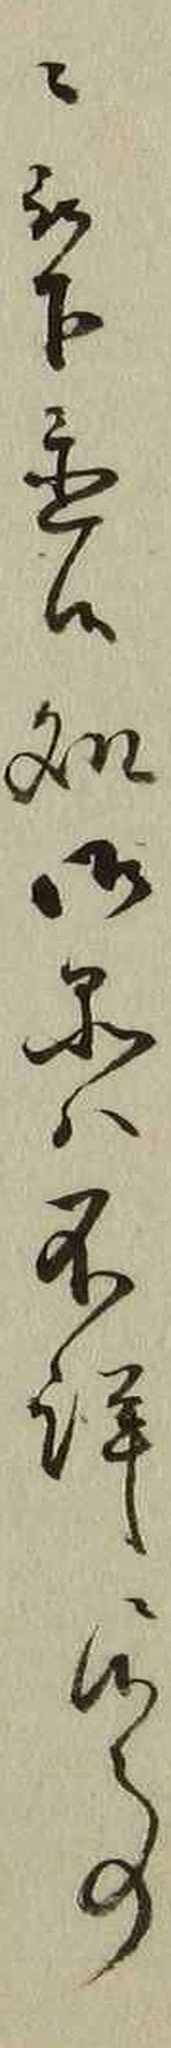々被下置候処御品ハ不詳ニ候事
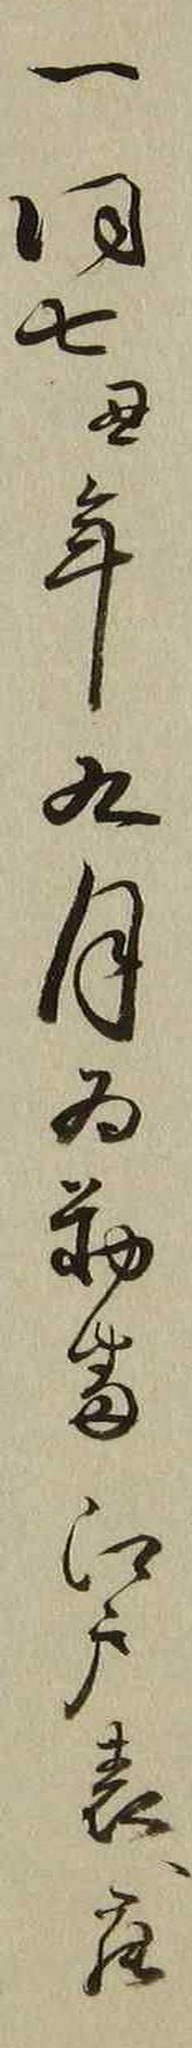一同七丑年九月為勤番江戸表へ罷
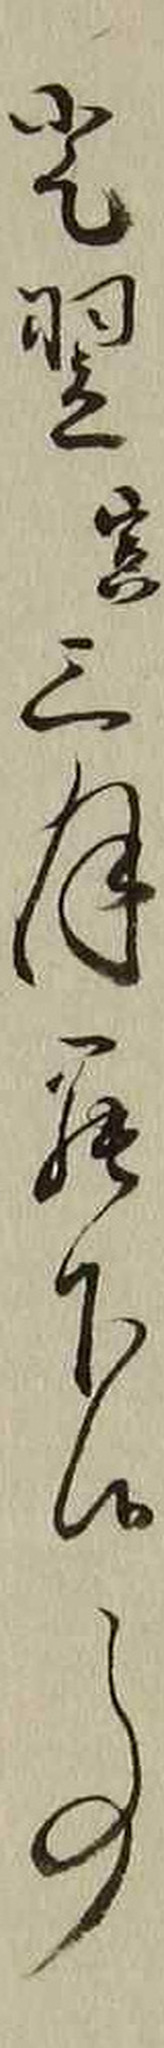登翌寅三月罷下候事
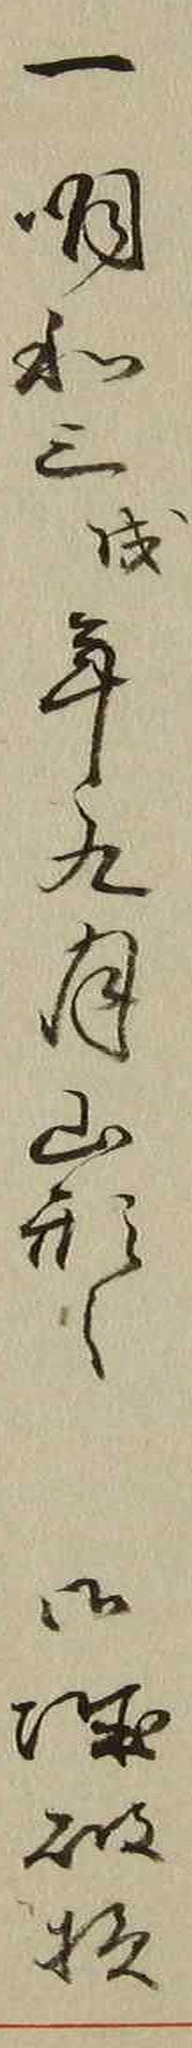一明和三戌年九月山形之御城破損
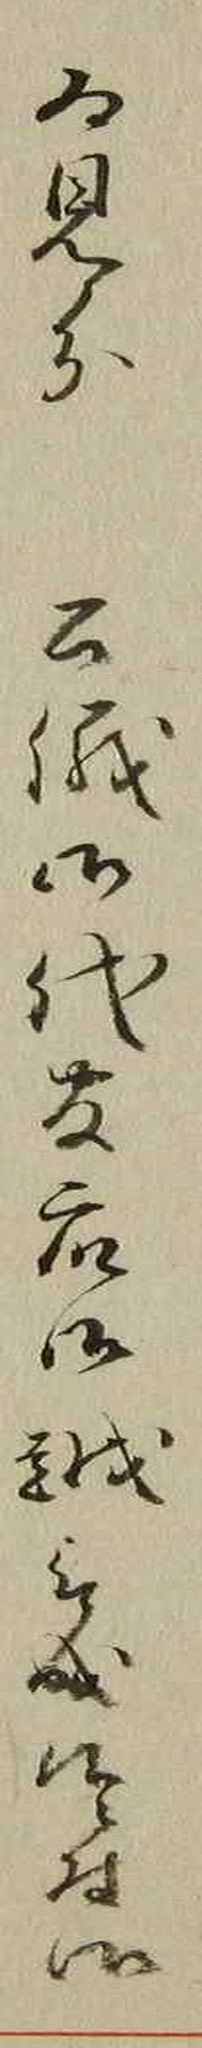為見分公儀御代官衆御越被成候ニ付御
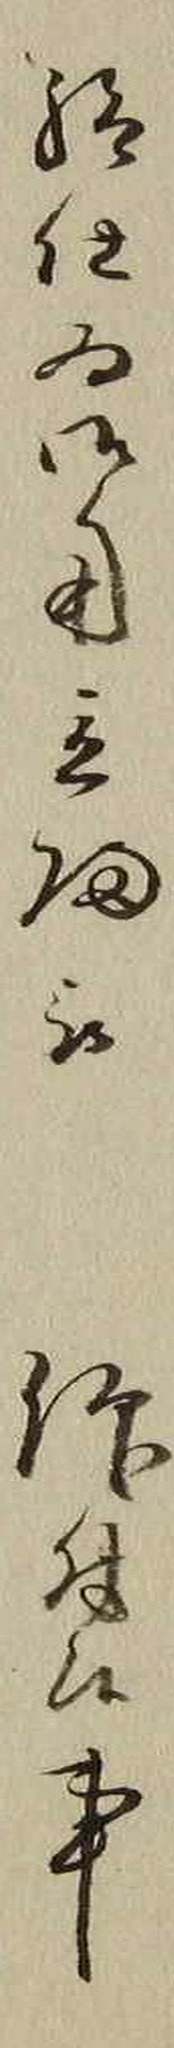給仕為御用立帰被仰付候事
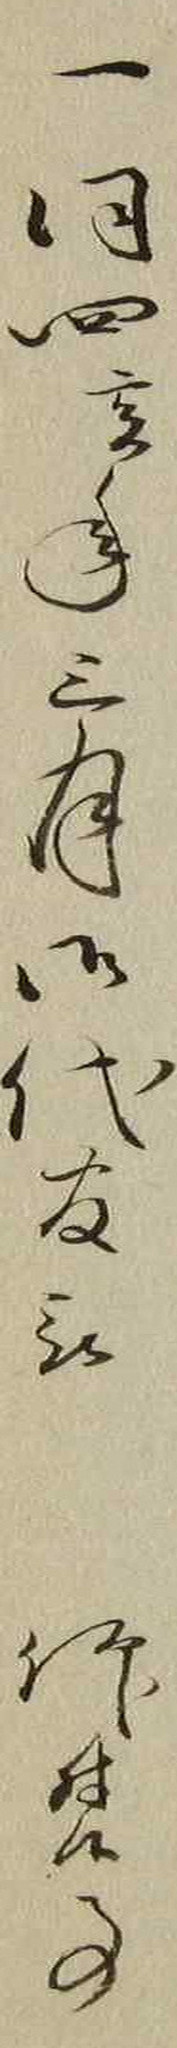一同四亥年三月御代官被仰付候事
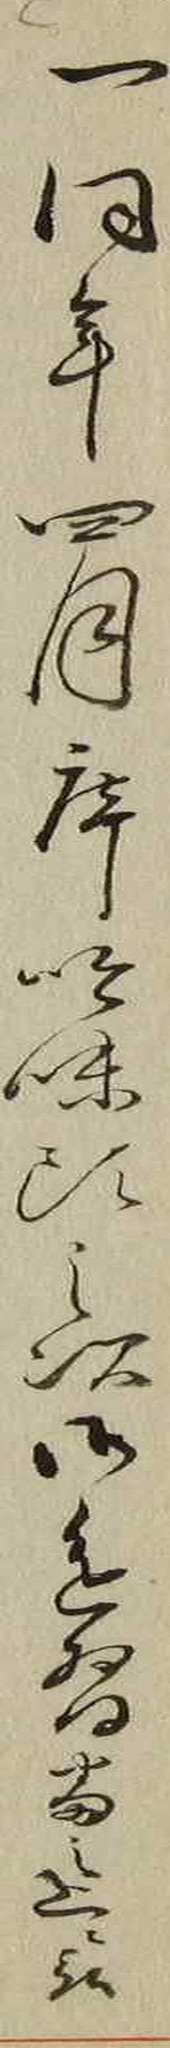一同年四月席吟味頭之次御近習番之上ニ被
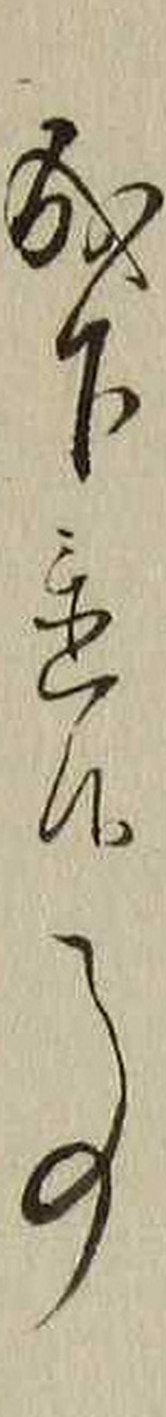成下置候事
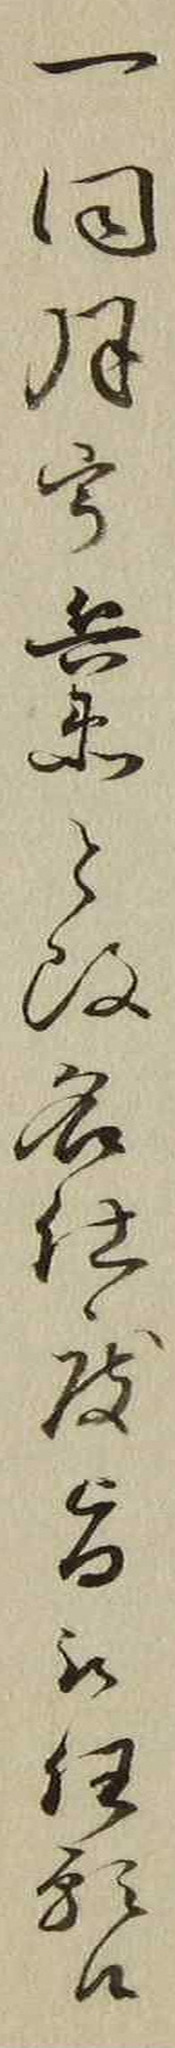一同月宇兵衛と改名仕度旨被任願候
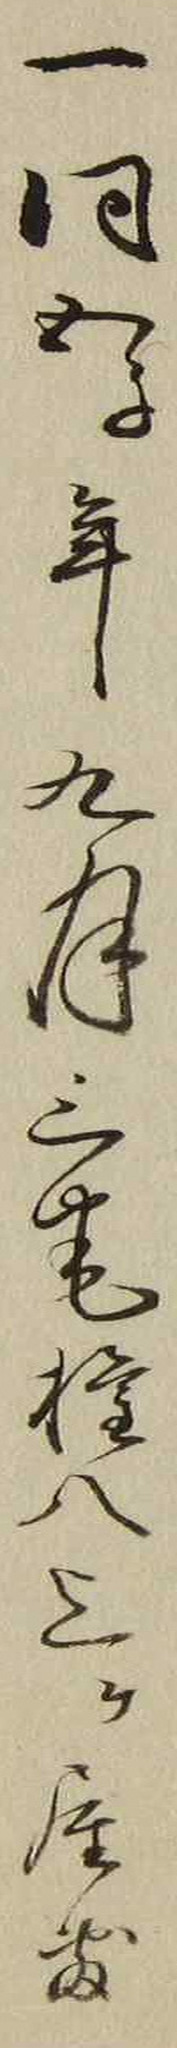一同五子年九月三宅権八上ケ屋敷
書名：諸士系譜　巻之4　い之部4
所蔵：会津若松市立会津図書館
